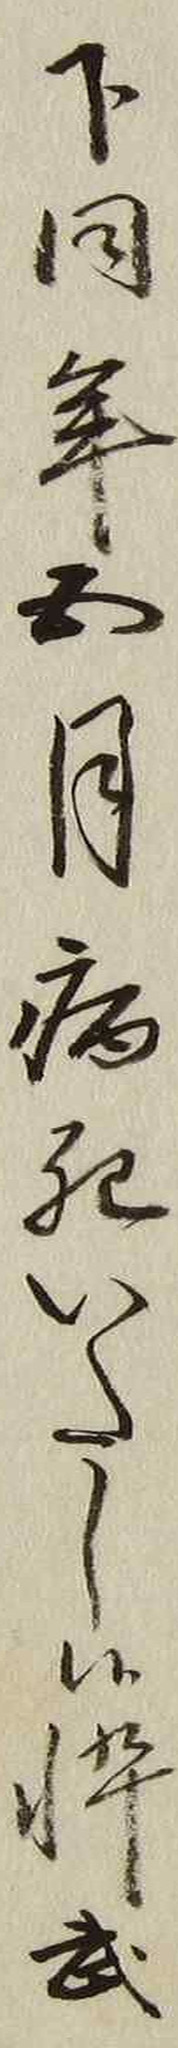下同年五月病死いたし候忰武
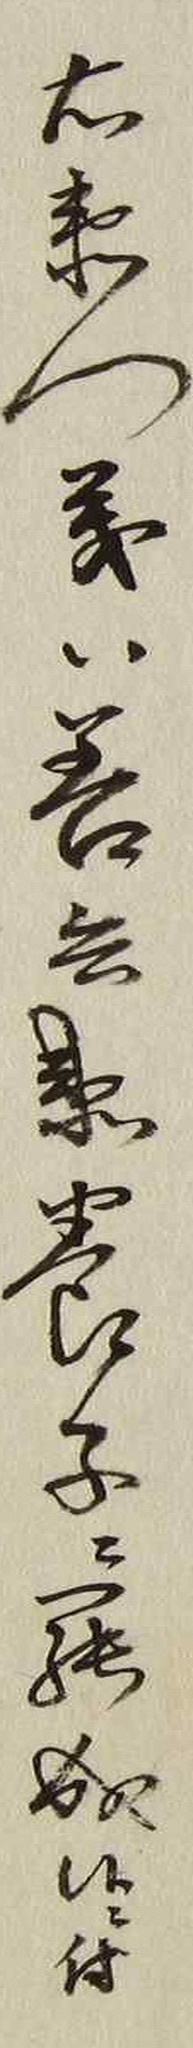右衛門義ハ善兵衛養子ニ罷成候ニ付
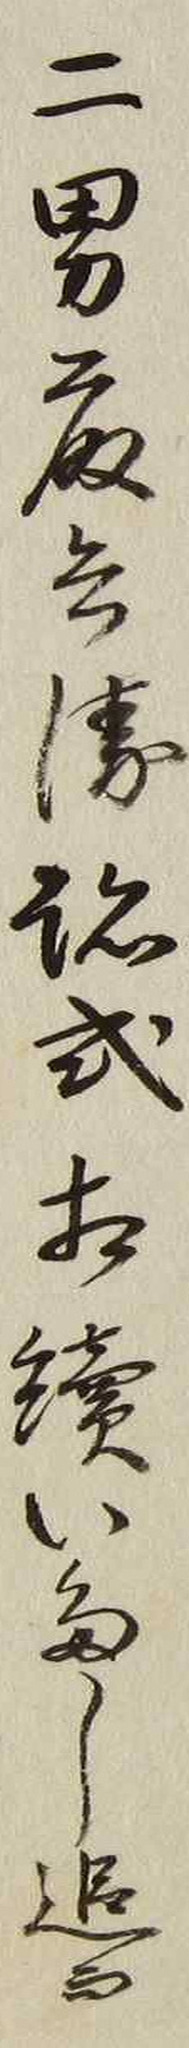二男藤兵衛跡式相続いたし追而
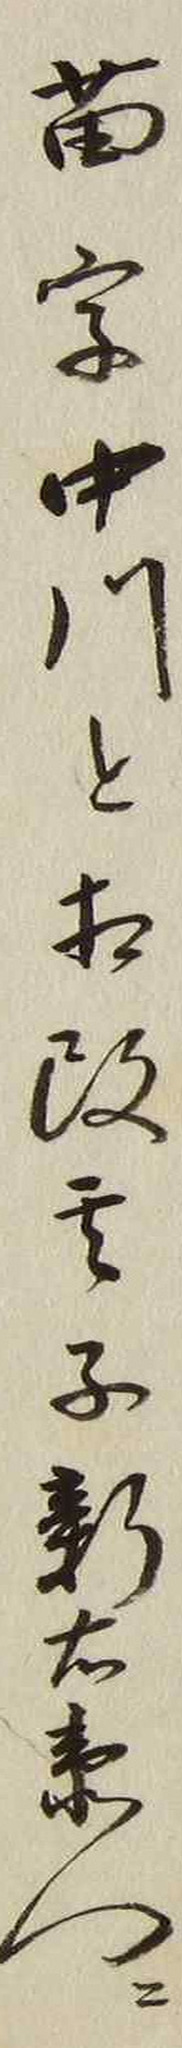苗字中川と相改其子新右衛門ニ
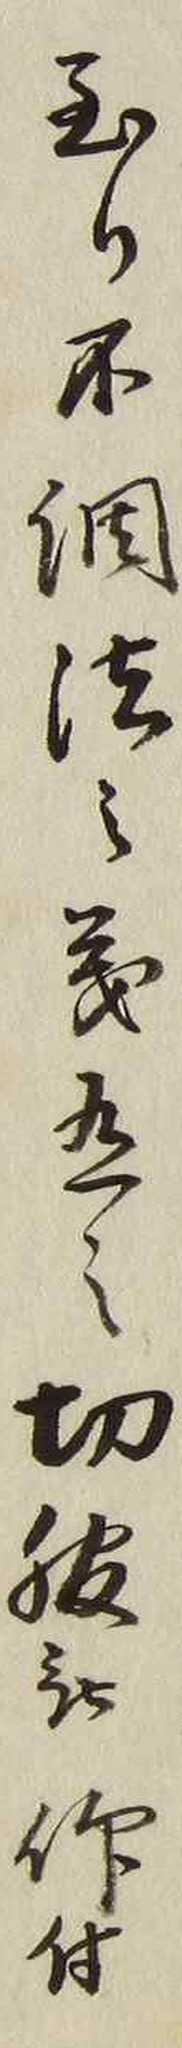至り不調法之義有之切服被仰付
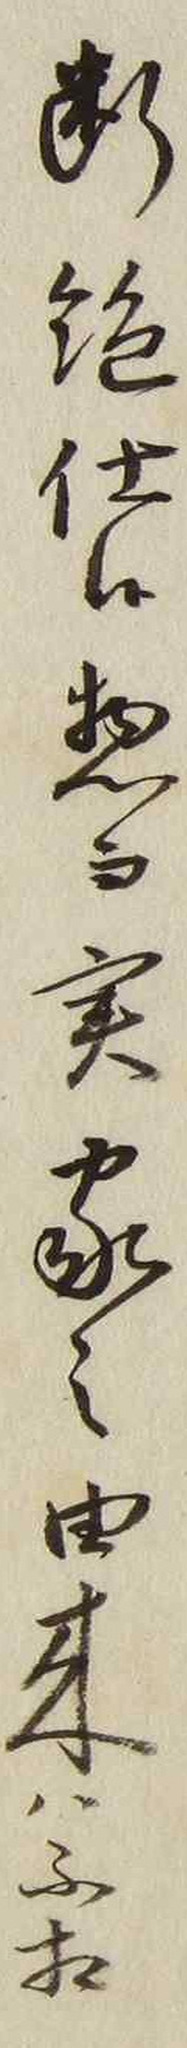断絶仕候惣而実家之由来ハ不相

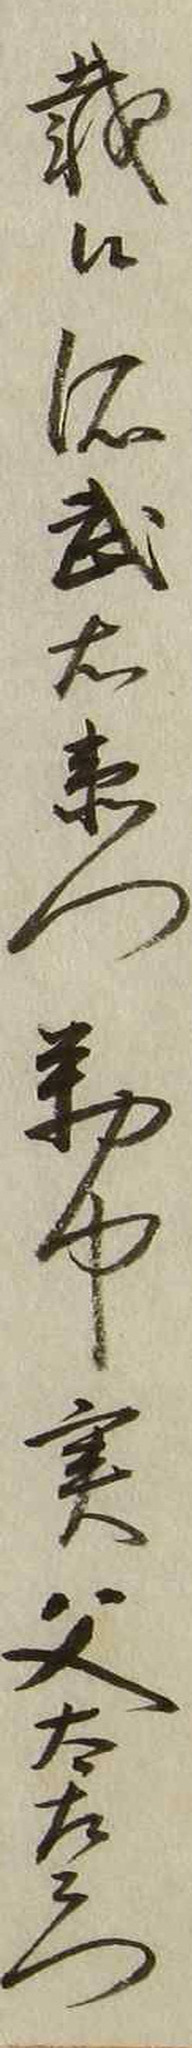載候所武右衛門勤中実父太左エ門
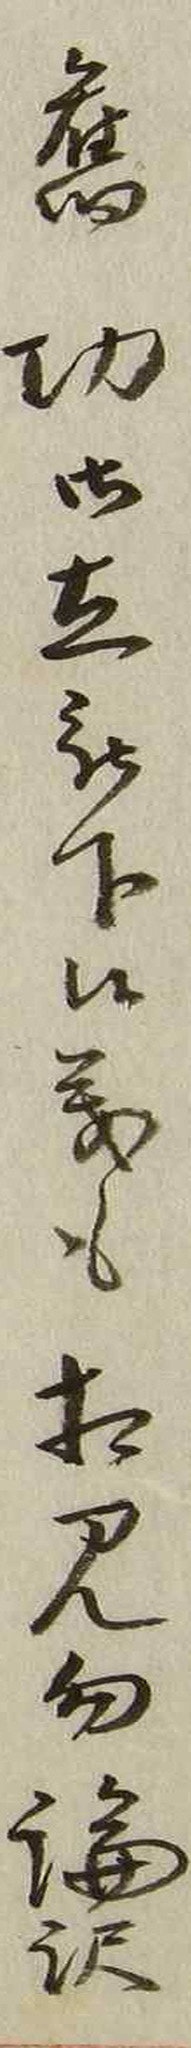旧功御立被下候義も相見勿論訳
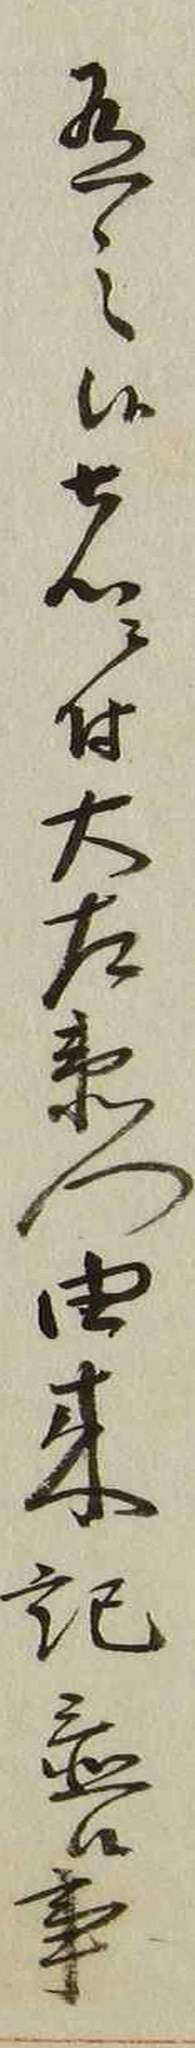有之候者ニ付大左衛門由来記置候事
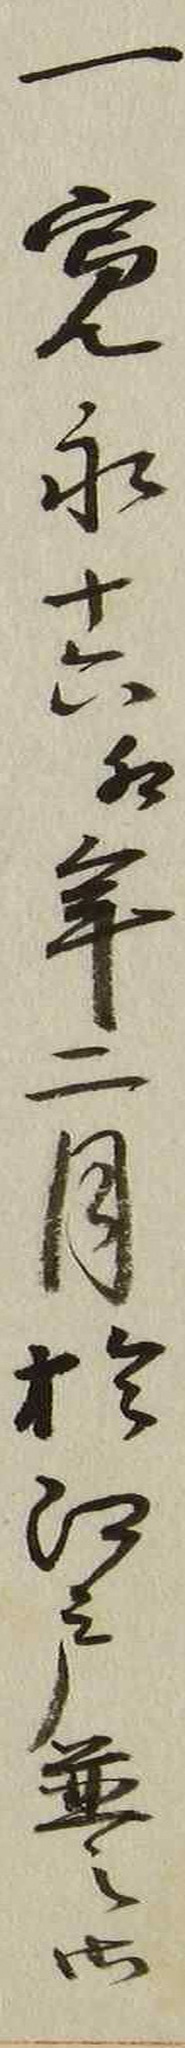一寛永十六卯年二月於江戸並之御
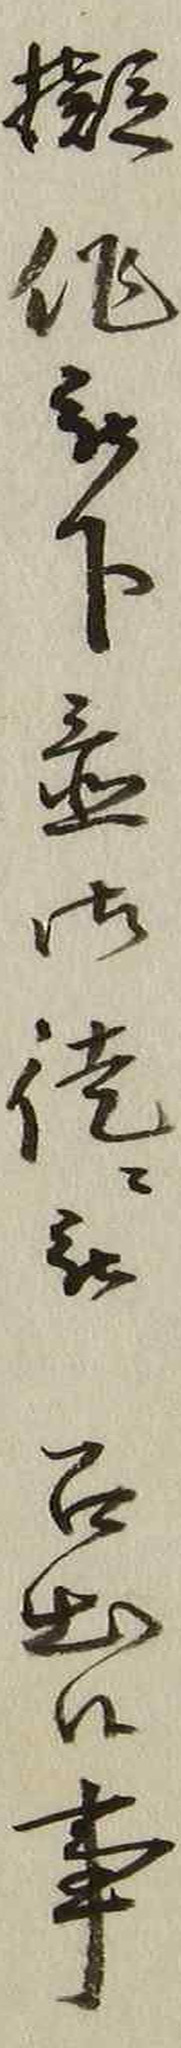擬作被下置御徒ニ被召出候事
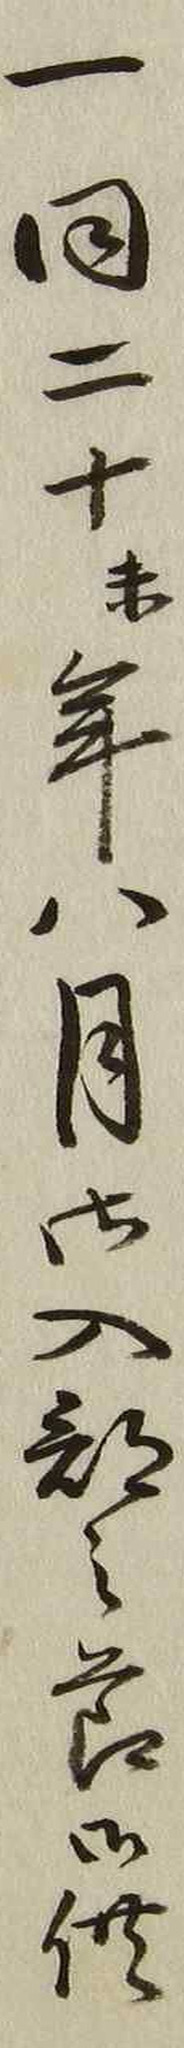一同二十未年八月御入部之節御供
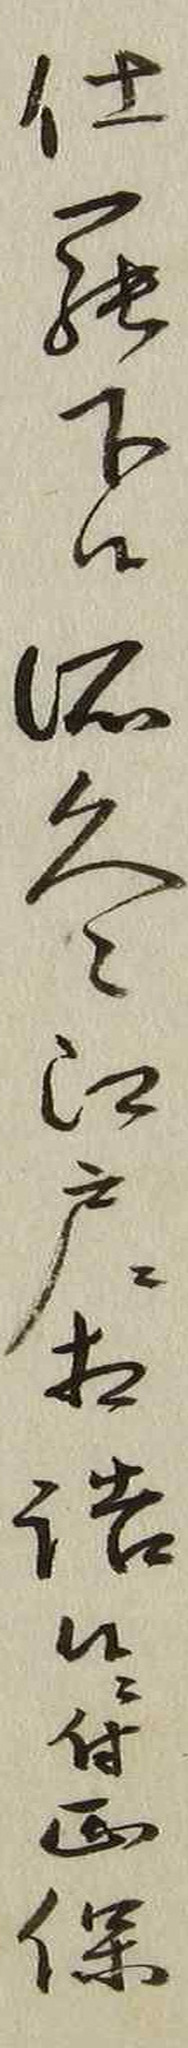仕罷下候所久々江戸ニ相詰候ニ付正保
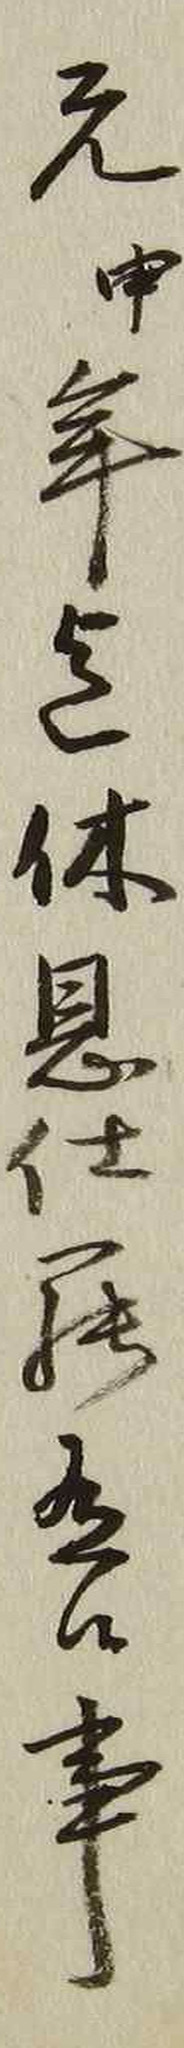元申年迄休息仕罷有候事
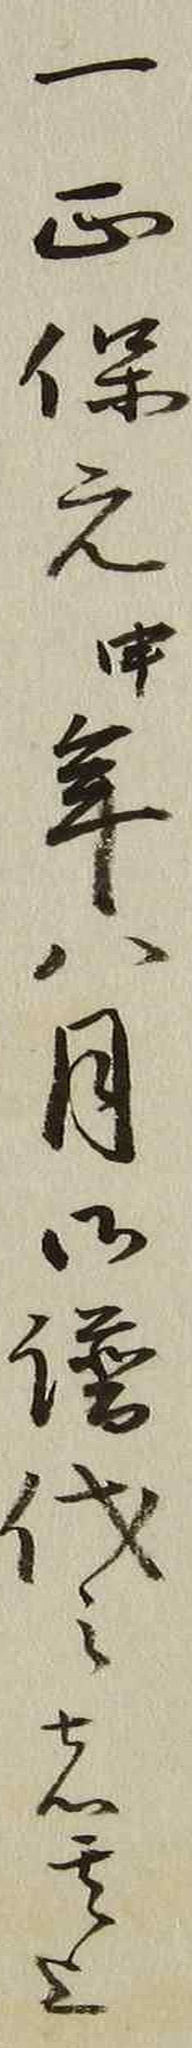一正保元申年八月御譜代之者其上
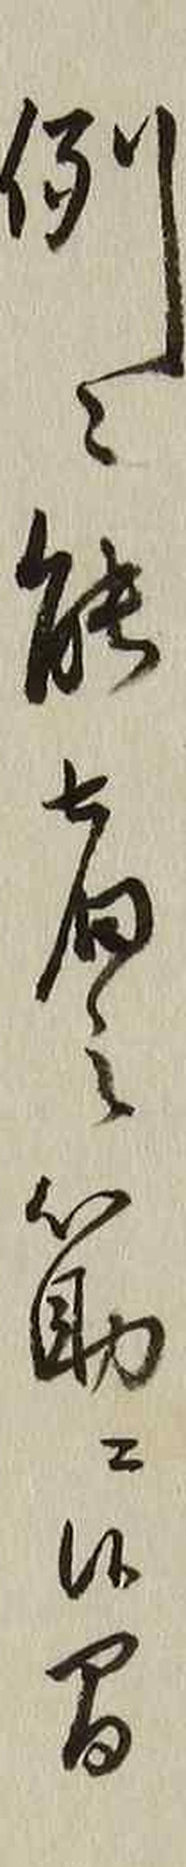例々能者之筋に候間
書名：諸士系譜　巻之149　そ之部2
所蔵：会津若松市立会津図書館
